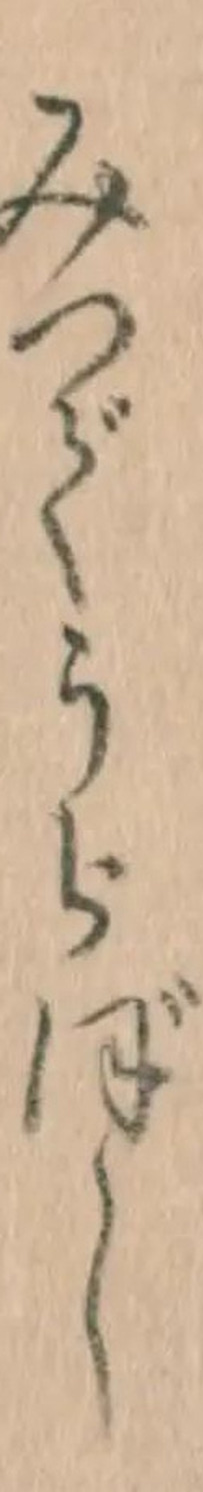みつでうらぼし
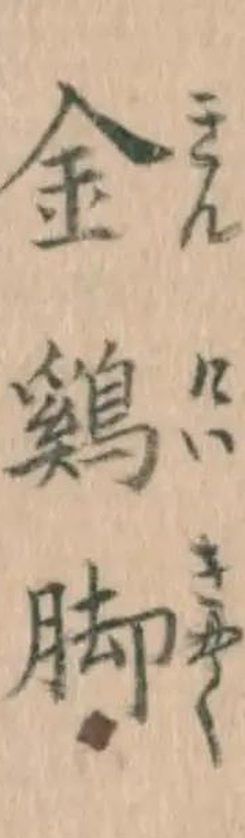金鶏脚
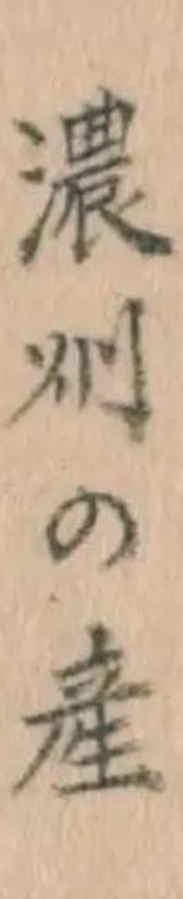濃州の産
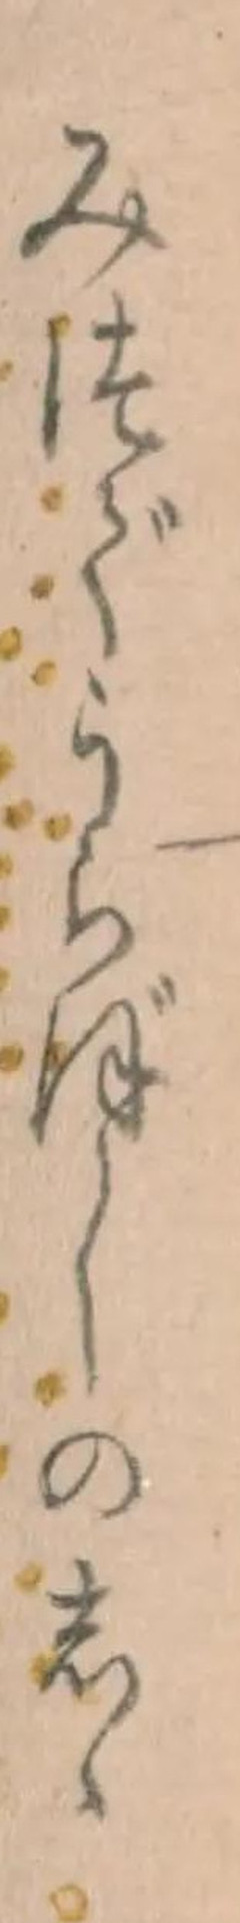みつでうらぼしのしゝ
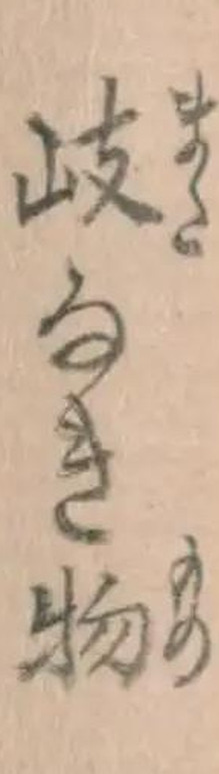岐なき物

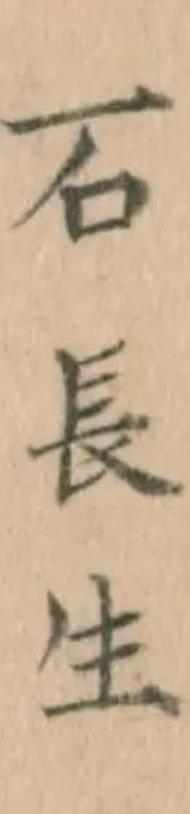石長生
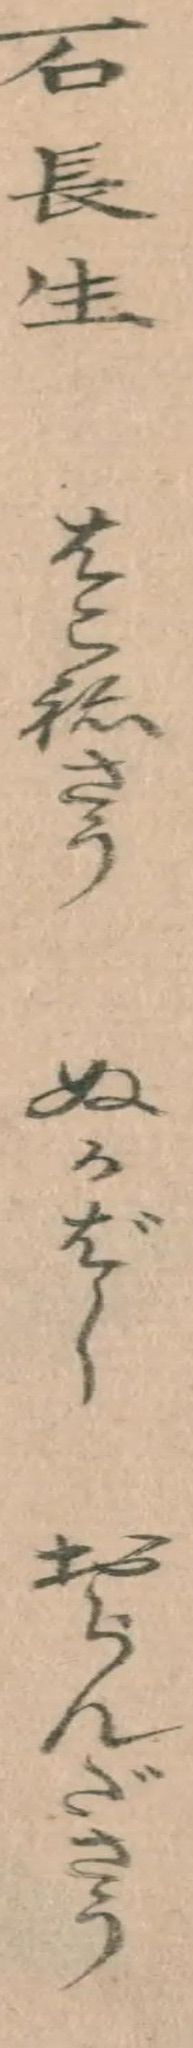石長生はこねさうぬかぼしおらんださう
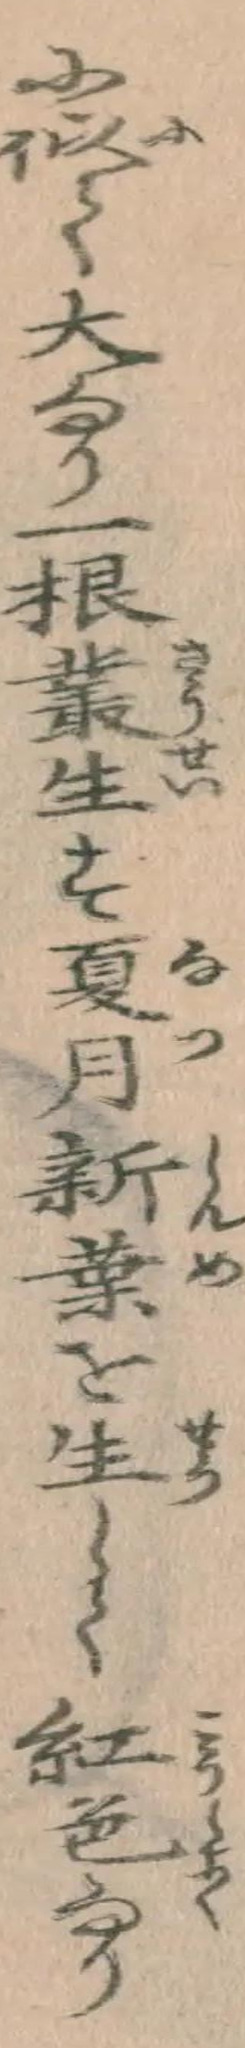に似て大なり一根叢生す夏月新葉を生して紅色なり
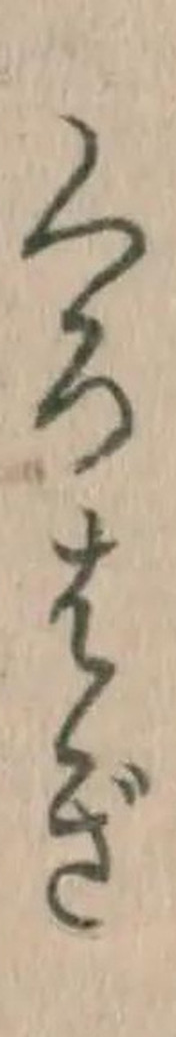くろはぎ
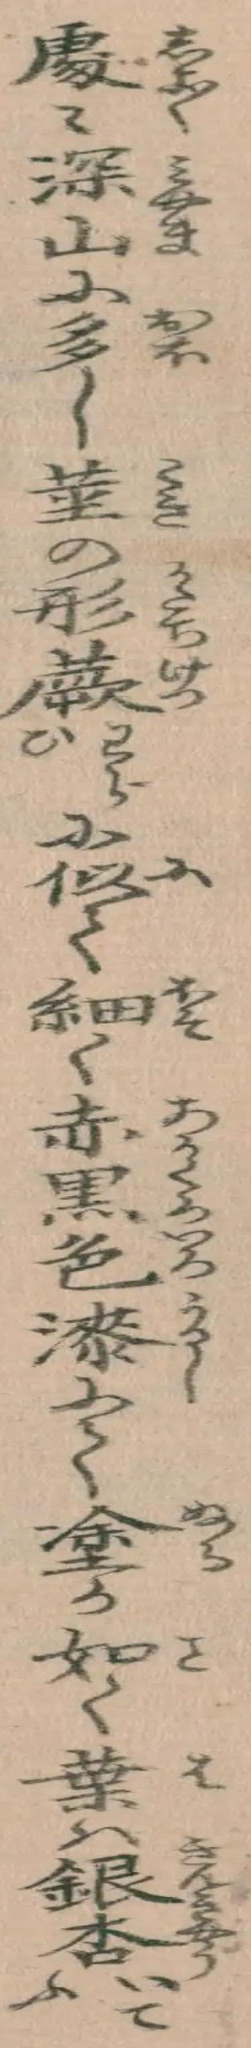処々深山に多し茎の形蕨わらひに似て細く赤黒色漆にて塗か如く葉は銀杏いてふ
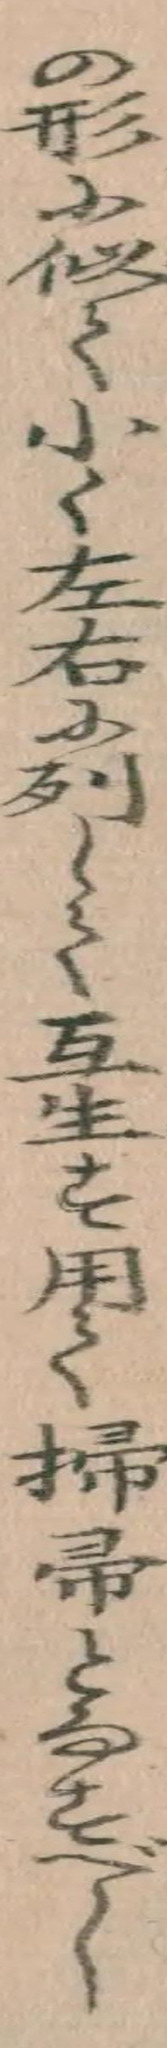の形に似て小く左右に列して互生す用て掃帚となすべし
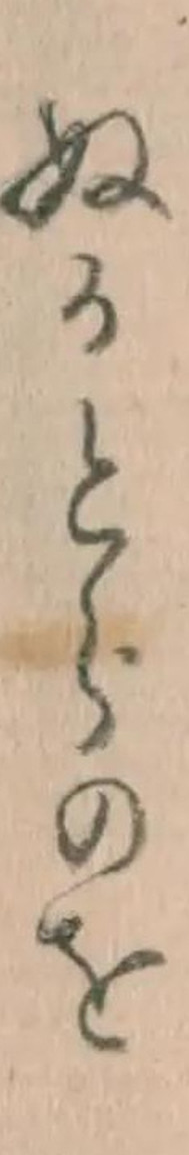一種とらのを
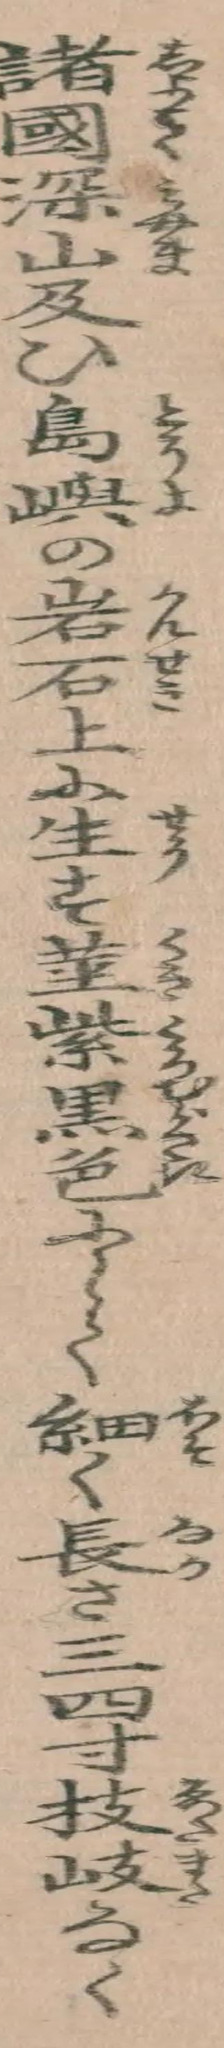諸国深山及ひ島嶼の岩石上に生す茎紫黒色にして細く長さ三四寸枝岐なく
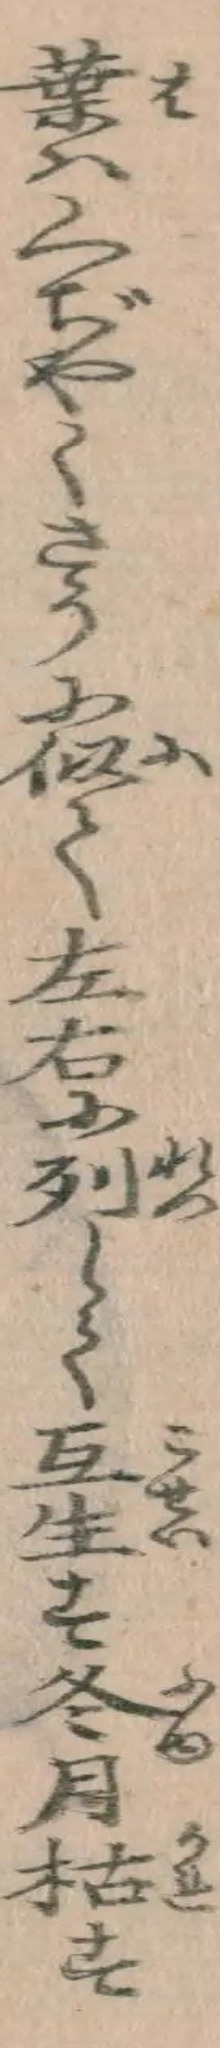葉はくぢやくさうに似て左右に列して互生す冬月枯す
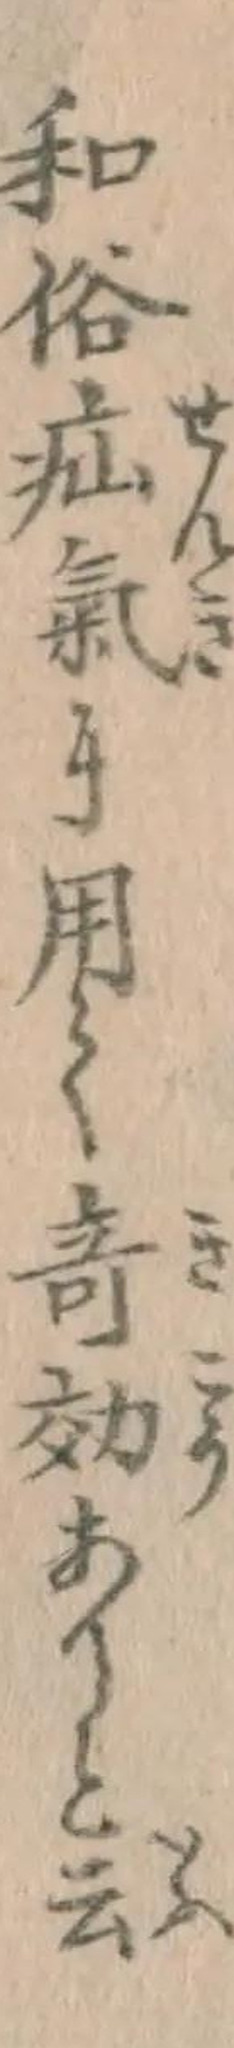和俗疝気に用て奇効ありと云
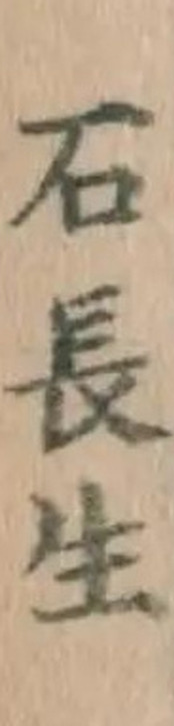石長生
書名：本草図譜. 巻34-36
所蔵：国立国会図書館 National Diet Library, JAPAN
